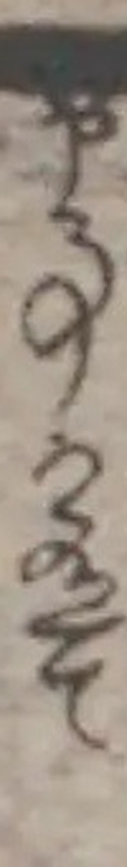申事か有て
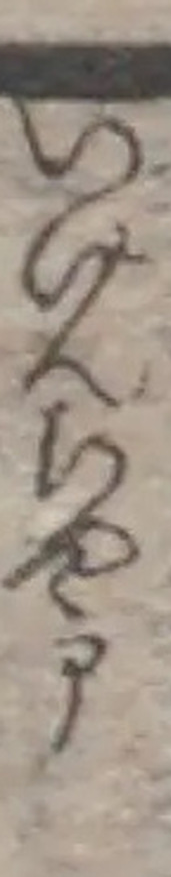いけんちやア
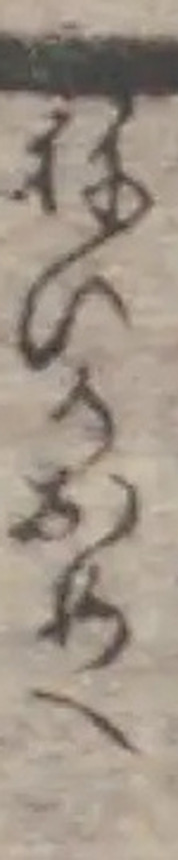ねいかおめへ
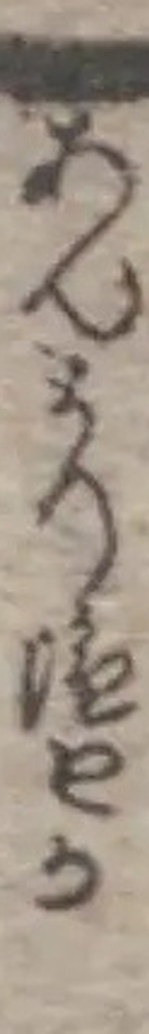あんまりとか
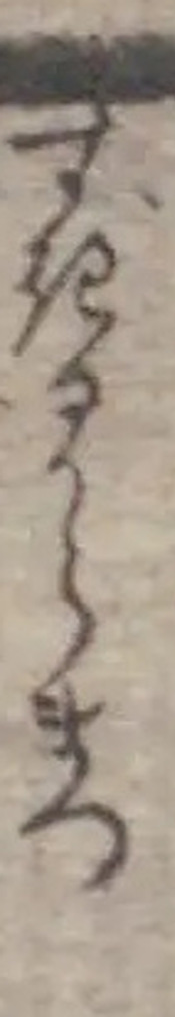すきるからまつ
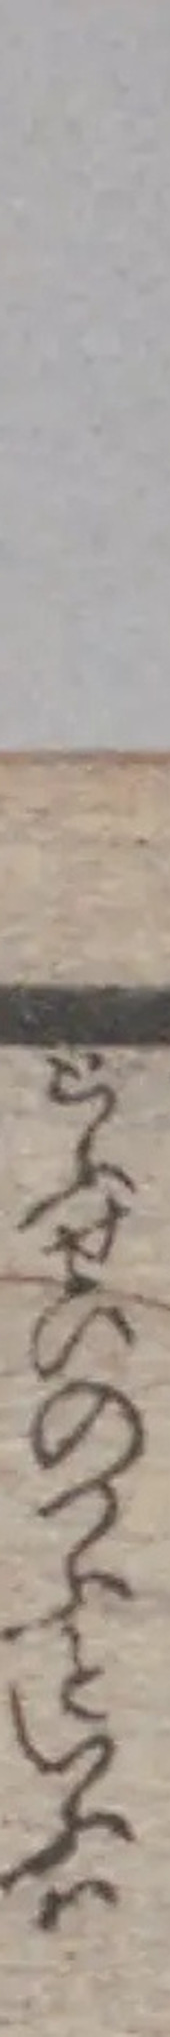とふせいのつふといふは
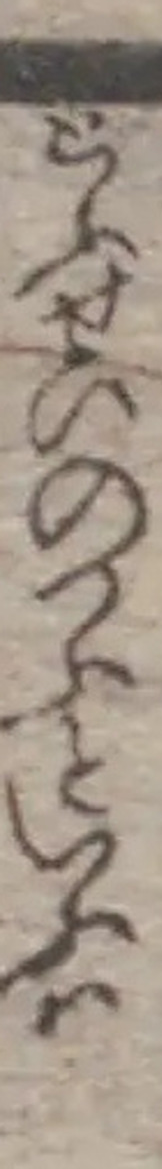とふせいのつふといふは
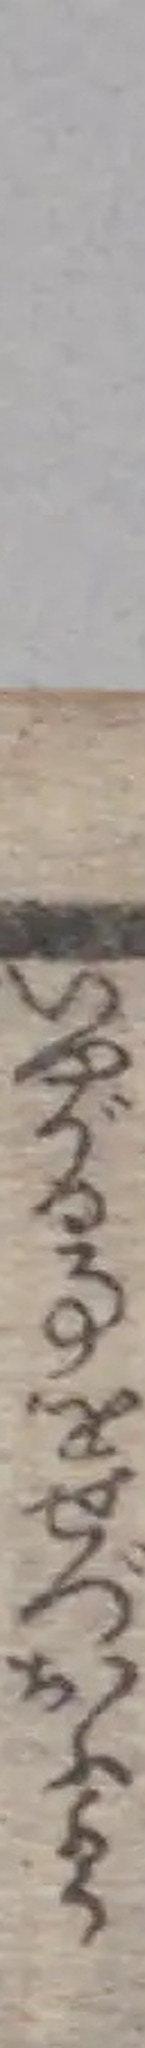いやがる事をせづおふよう
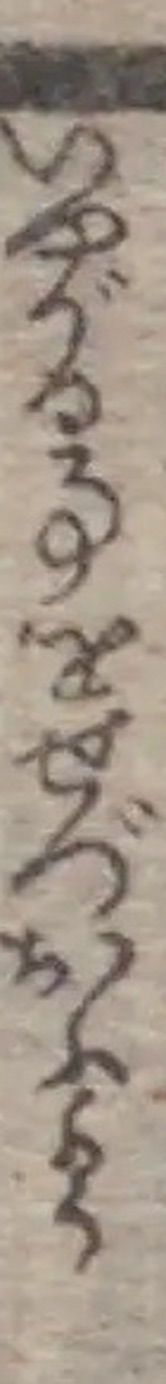いやがる事をせづおふよう
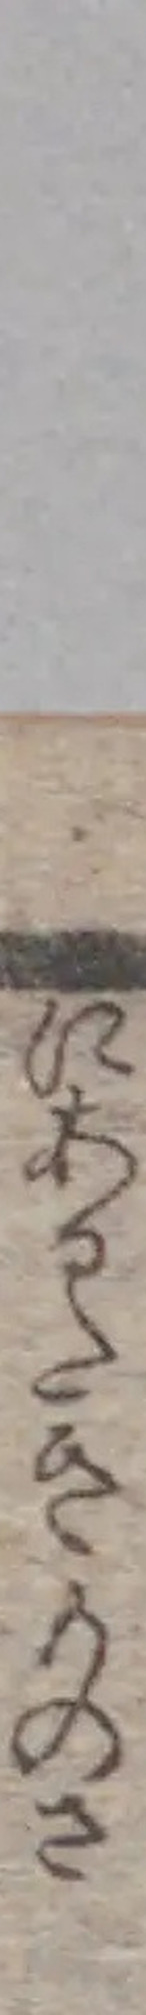にあるたきものさ
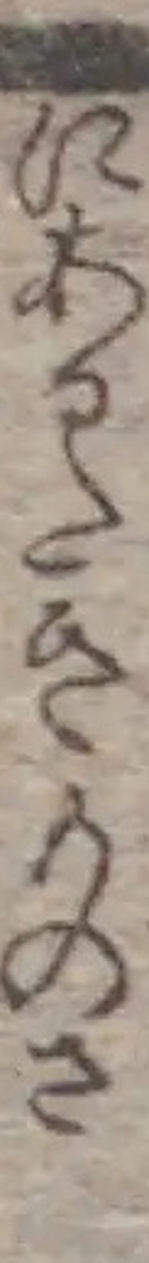にあるたきものさ
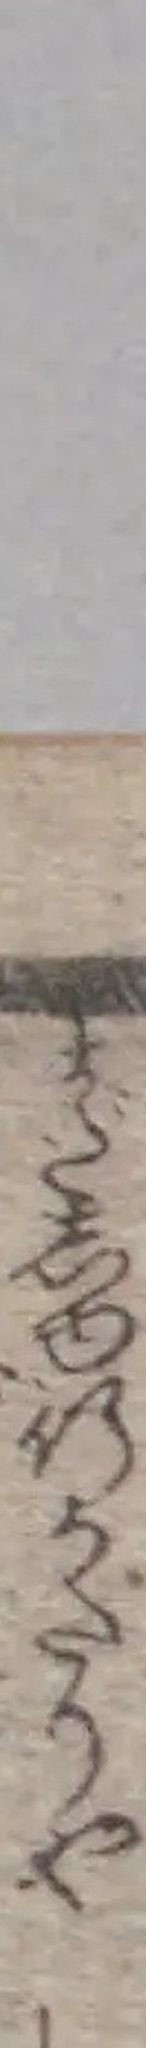まだしゆ行かたりや
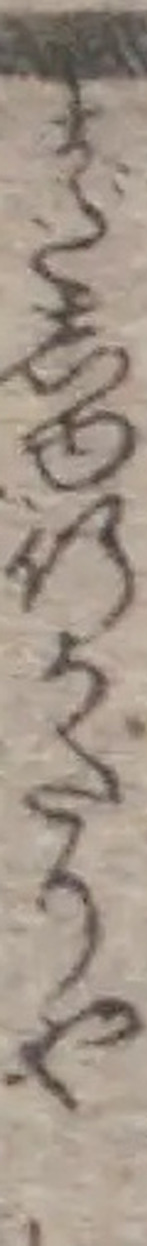まだしゆ行かたりや
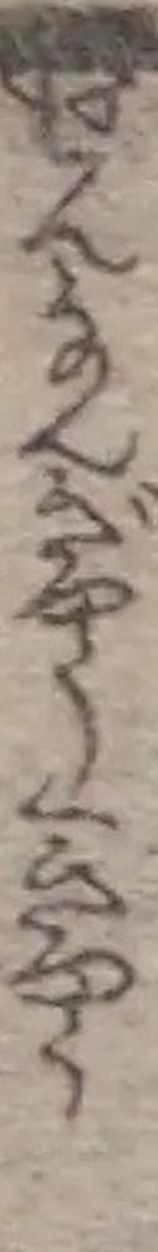せんなんぎやうくきやう
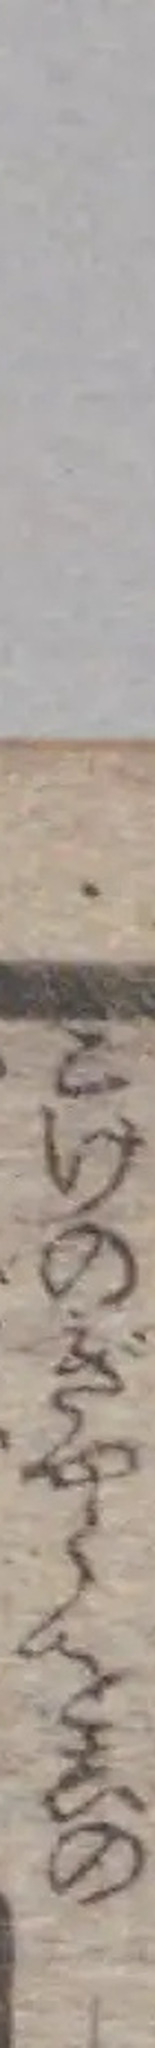こけのぎやうをしの
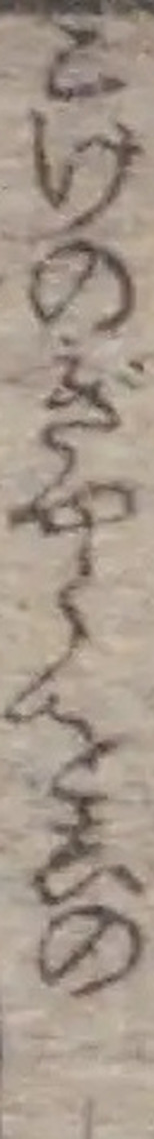こけのぎやうをしの
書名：早出来 3巻
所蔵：国立国会図書館 National Diet Library, JAPAN
